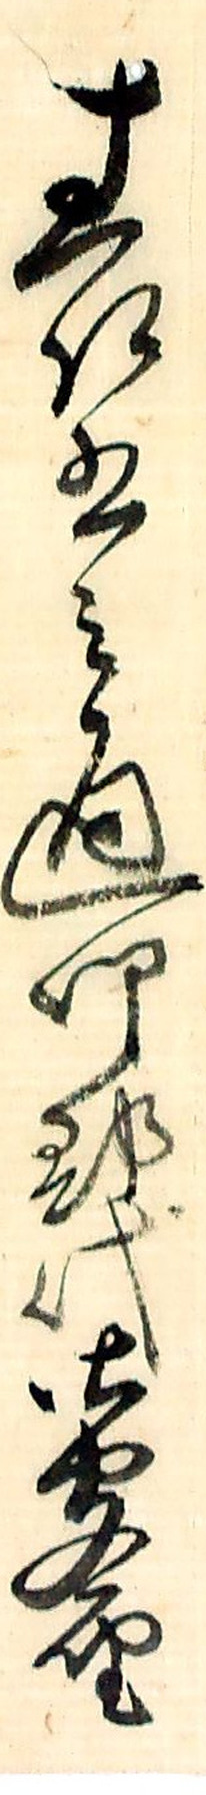表書之通御郡代御聞届
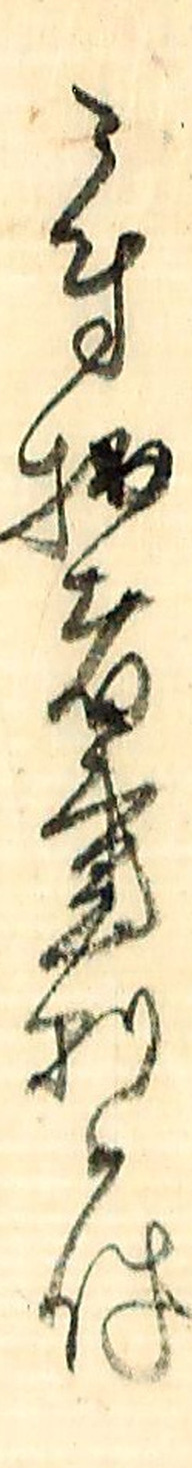に付拙者裏判如件
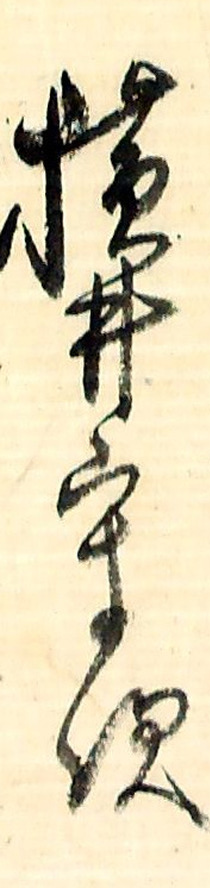横井守次
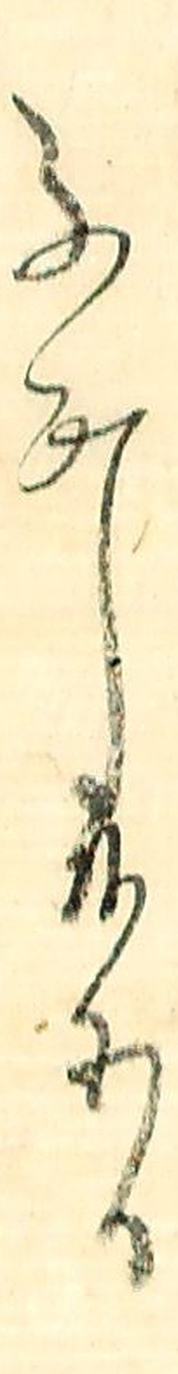子正月廿五日
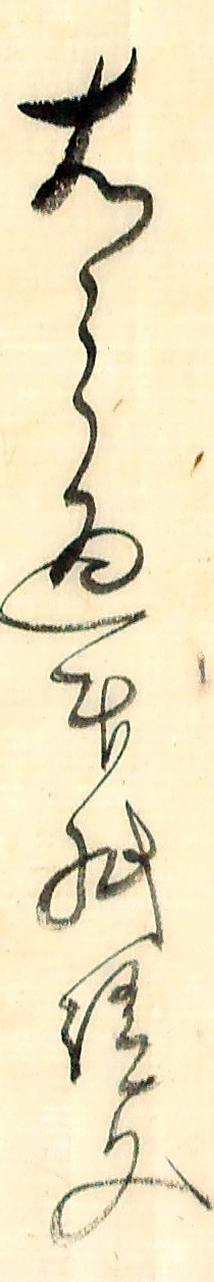右之通本紙証文
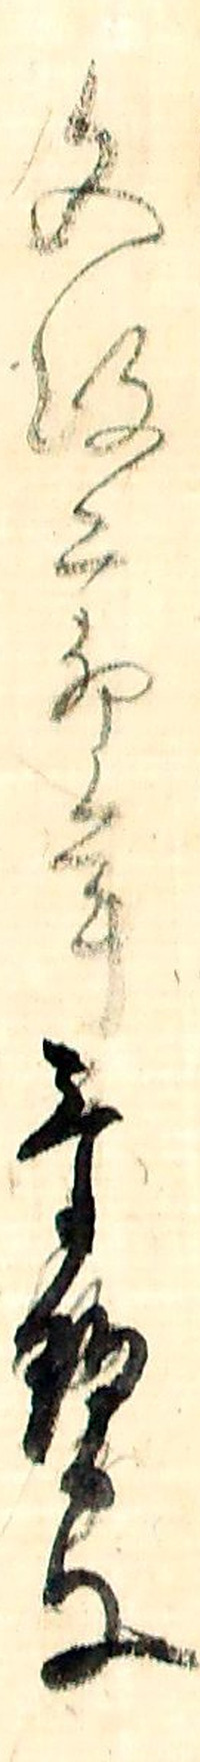文政二卯年寺野与

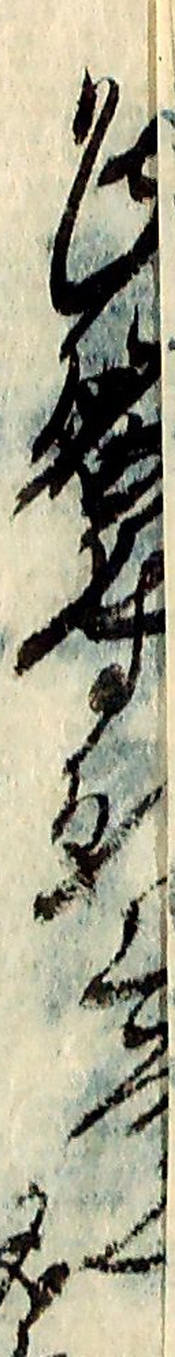乍恐奉願上覚
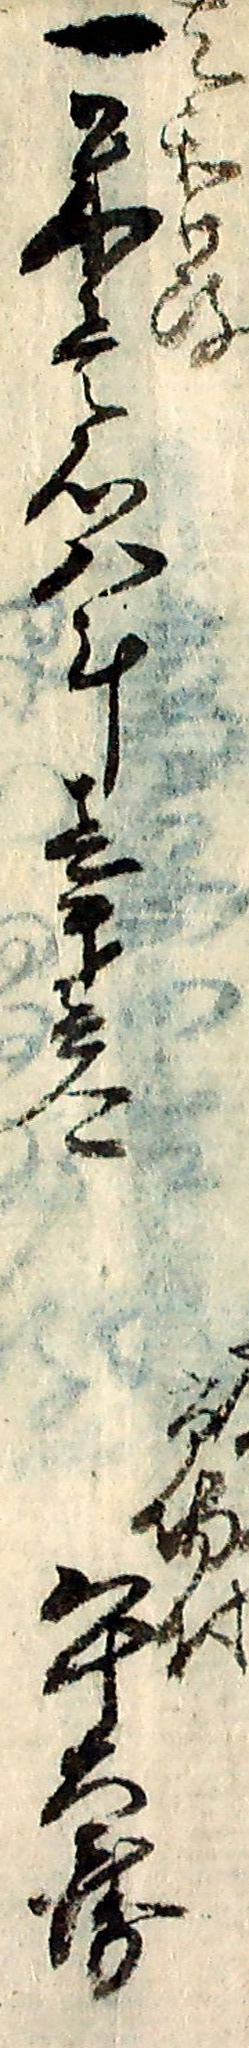一米壱石八斗壱升壱合平六兵衛
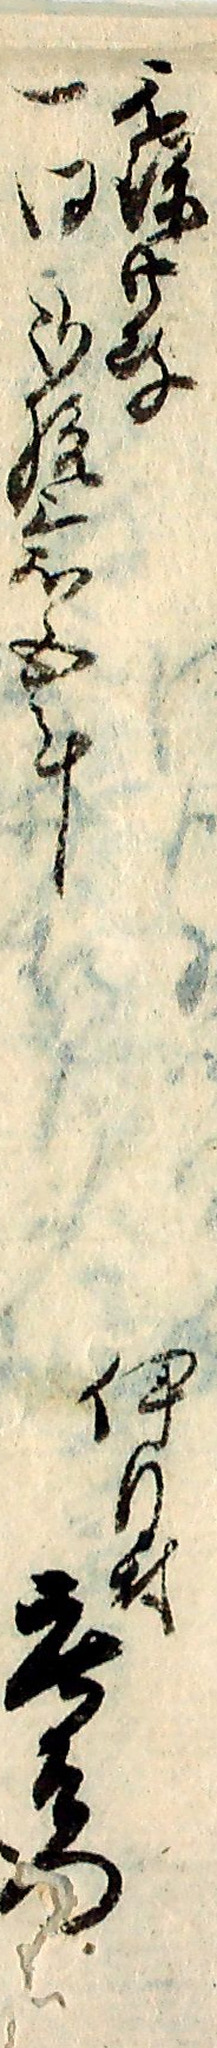一同弐拾三石五斗庄左衛門
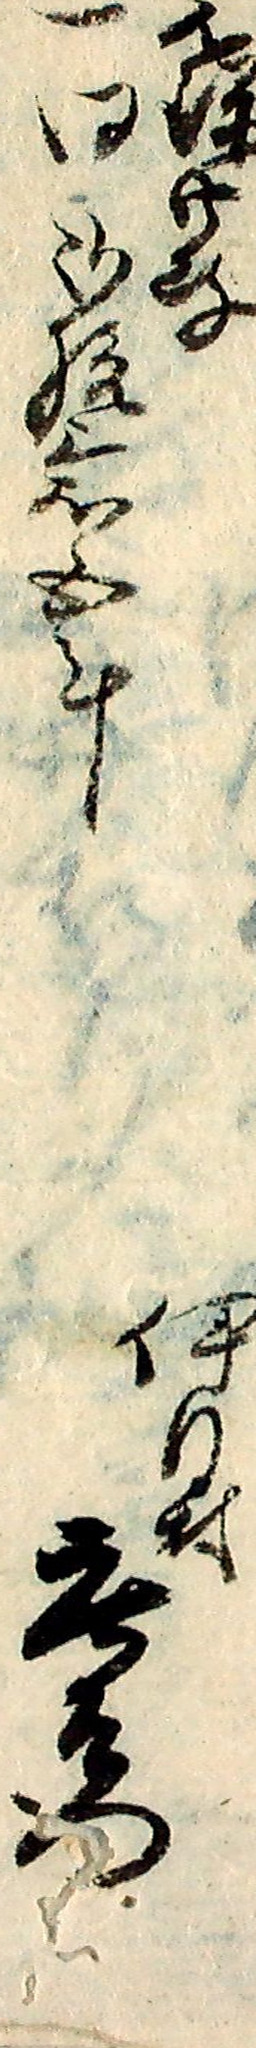一同弐拾三石五斗庄左衛門
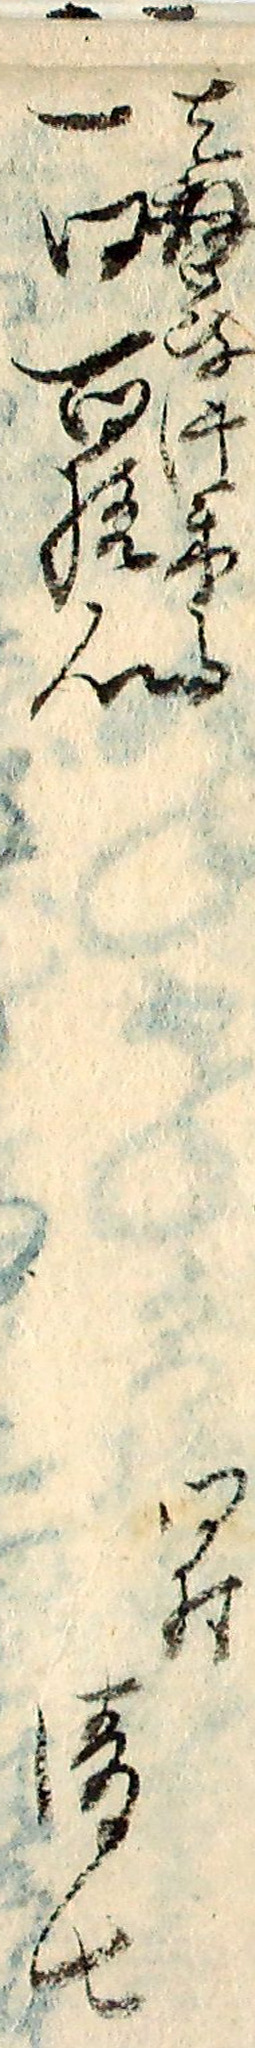一同百拾石清七
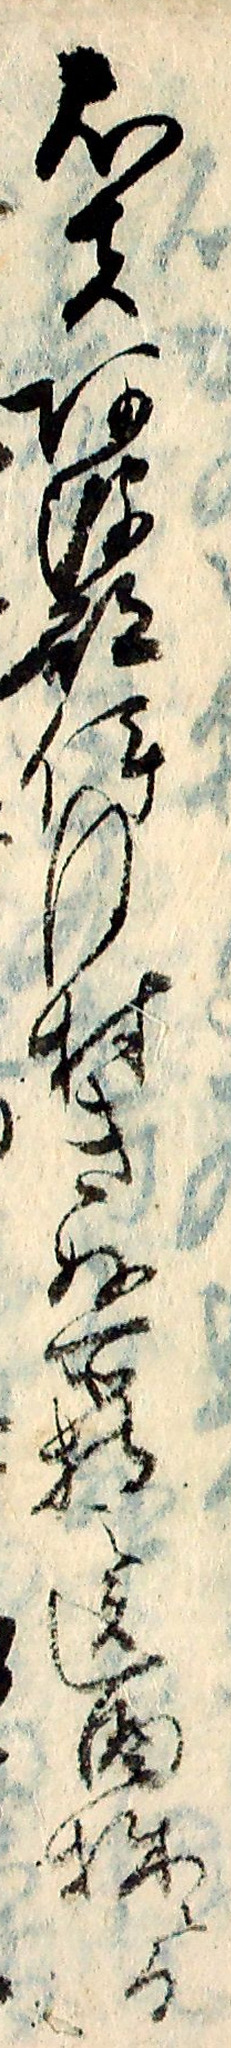右は阿波郡伊月村きぬ所持之造酒株にて
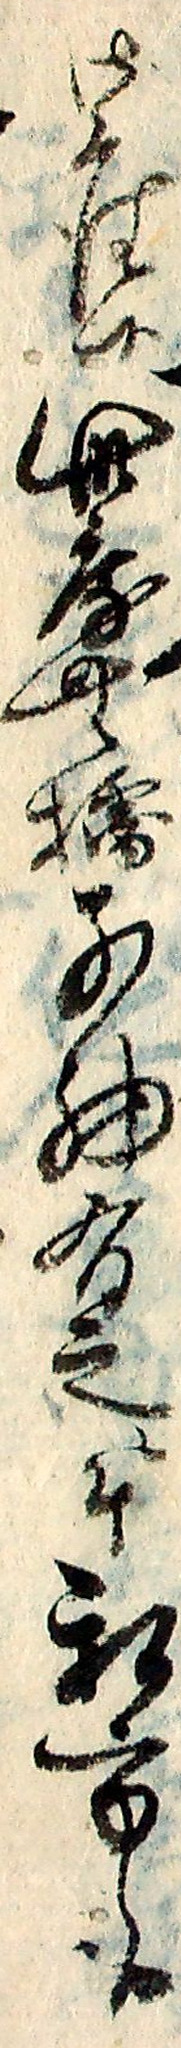御座候此度無拠子細有之に付私方え
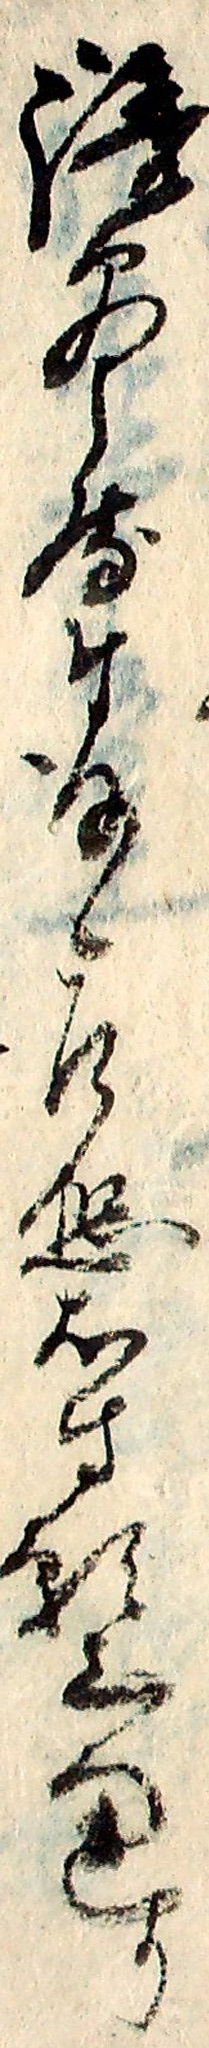譲受申度奉存候乍恐右奉願上通り

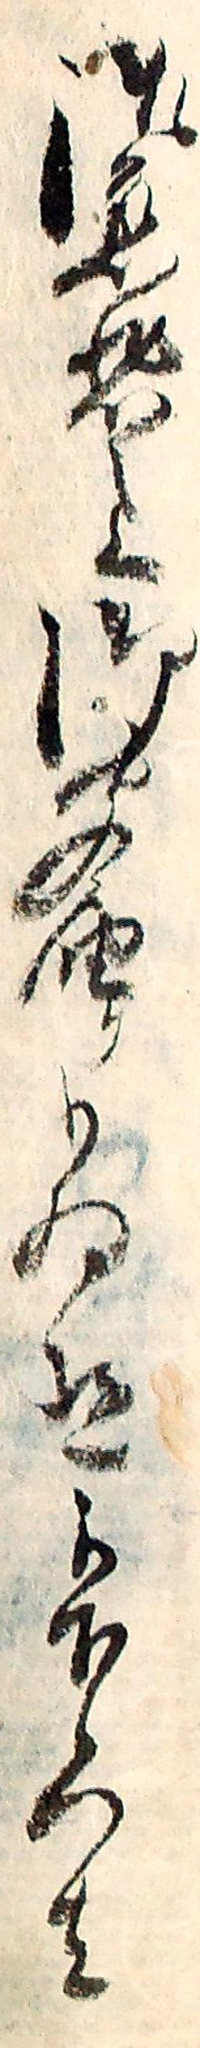御慈悲之上御聞届け被為遊被下候へは
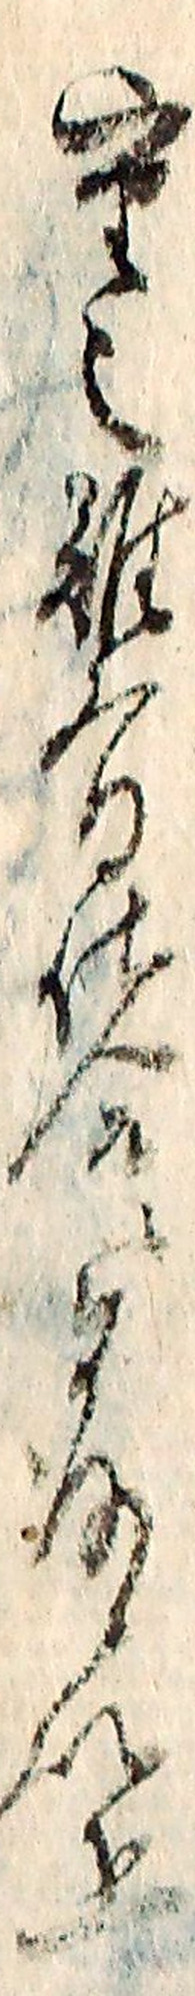重々難有仕合に奉存候以上
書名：諸御願書控(後藤氏壱番）
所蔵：鳴門教育大学 Naruto University of Education
